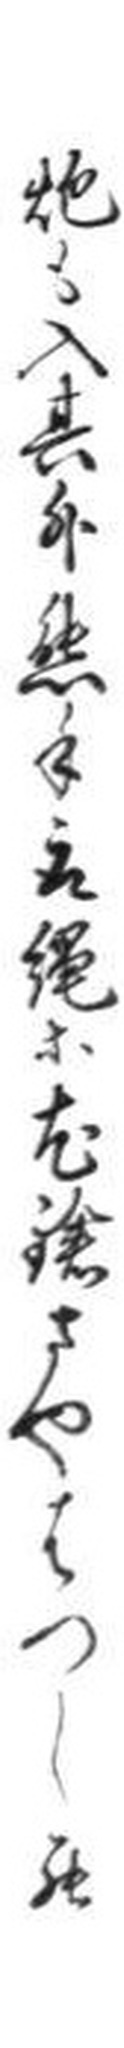炮も入其外熊手取縄等尤鎗さやはつし罷
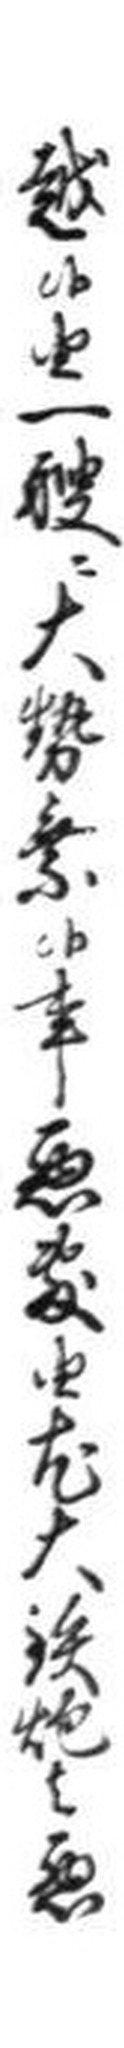越候由一艘ニ大勢乗候事悪敷由尤大鉄炮者悪
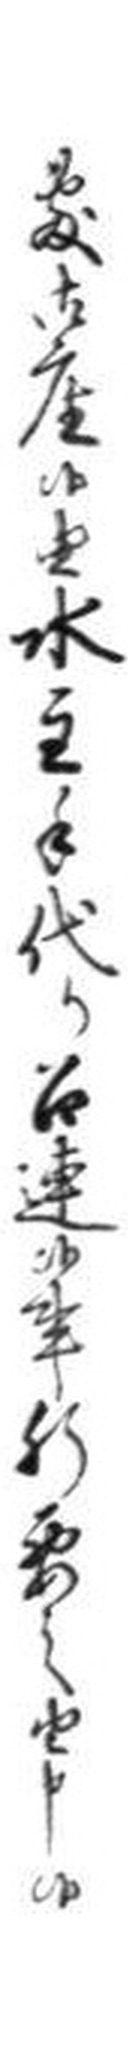敷御座候由水主手代り召連候事肝要之由申候
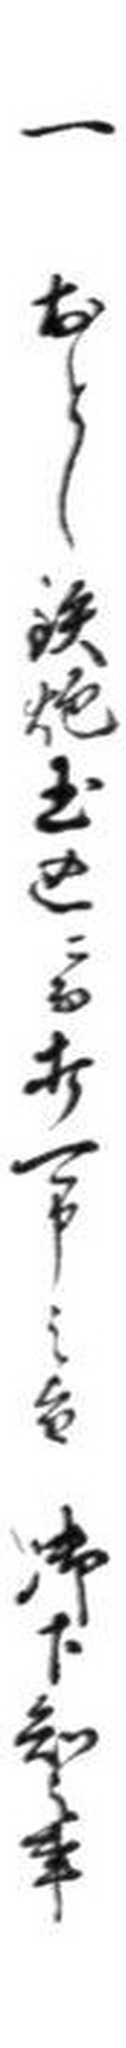一おとし鉄炮玉込ニ而打可申之旨御下知之事
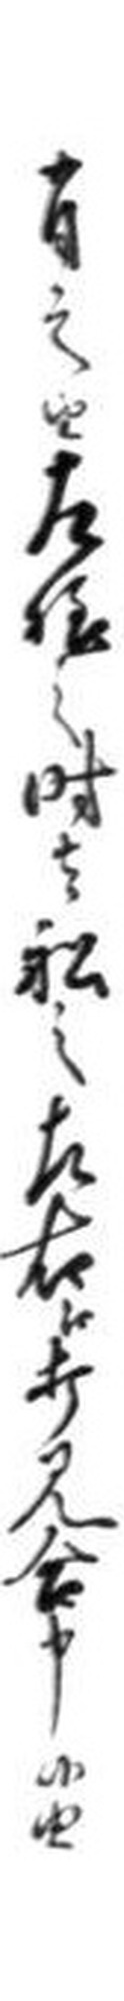有之由左様之時者船之左右江打見合申候由
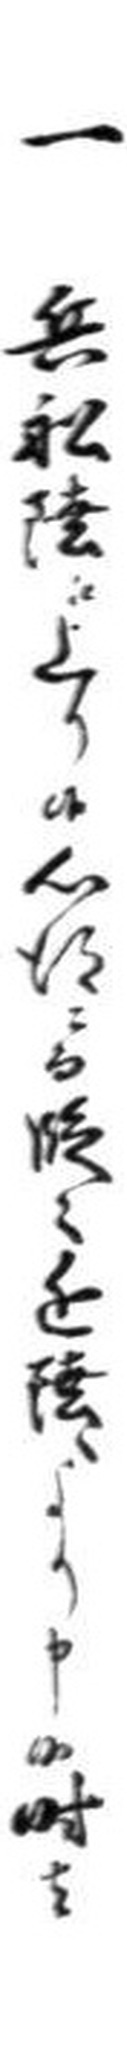一兵船陸江上り候心得ニ而段々近陸へより申候時者
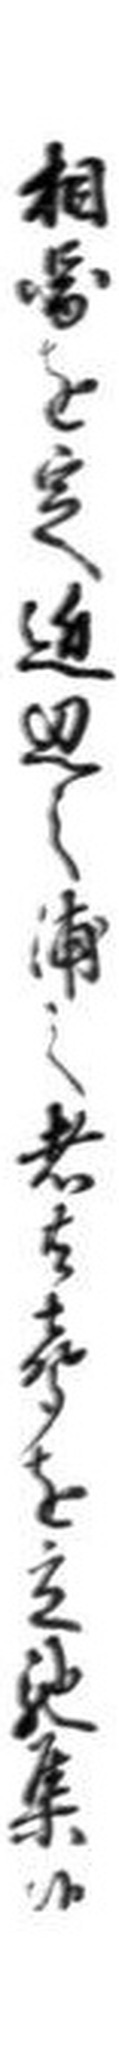相図を定近辺之浦之者共声を立馳集候
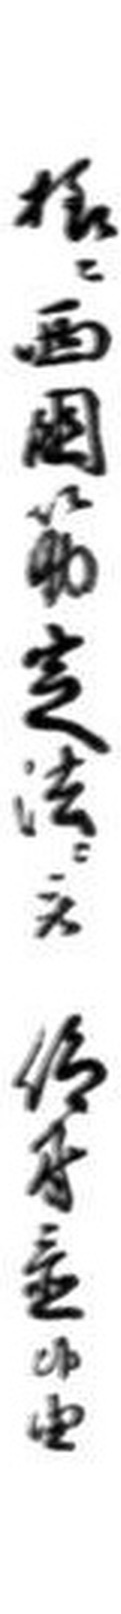様ニ西国筋定法ニ被仰付置候由
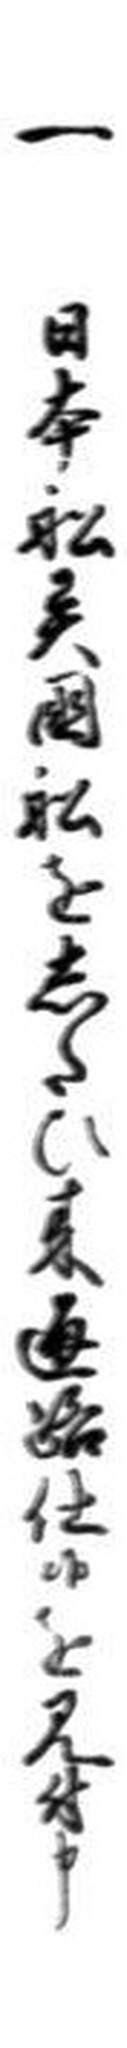一日本船異国船をしたひ来通路仕候を見付申
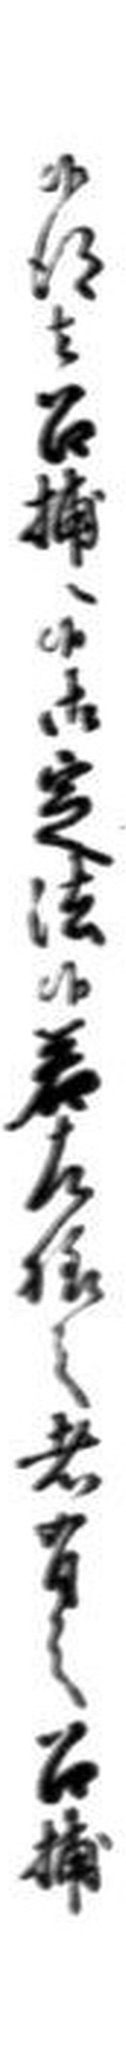候得者召捕へ候御定法候若左様之者有之召捕
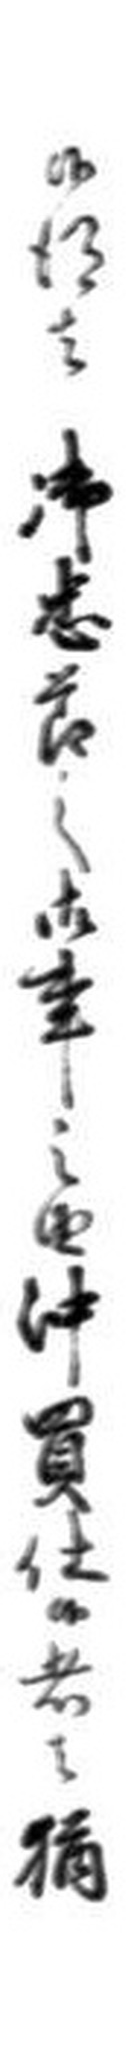候得者御忠節之御事之由仲買仕候者者猶
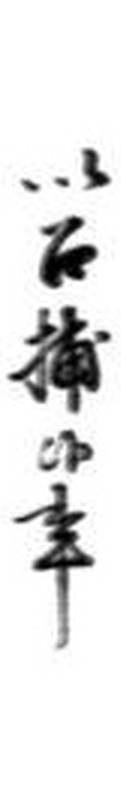以召捕候事
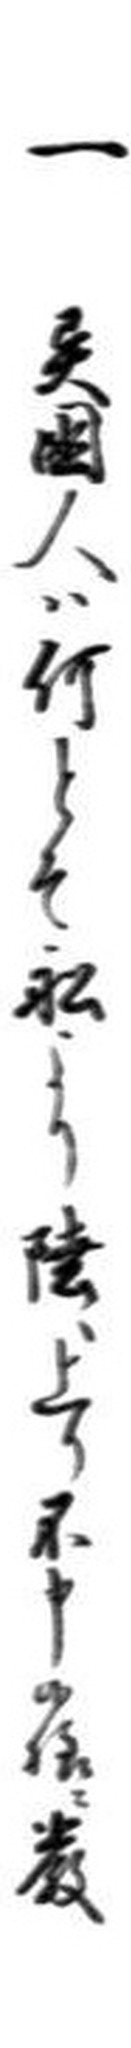一異国人ハ何とそ船より陸へ上り不申候様ニ厳
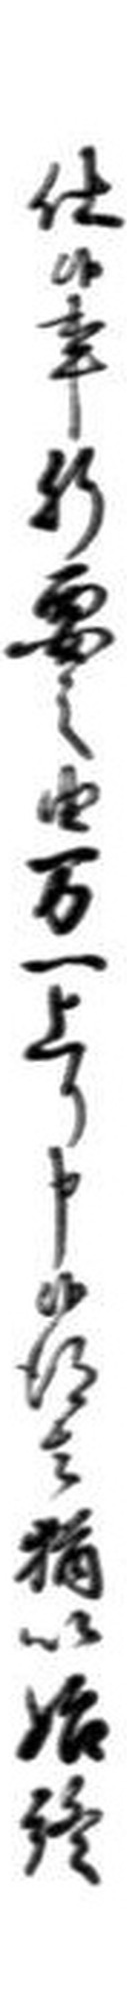仕候事肝要之由万一上り申候得者猶以始終
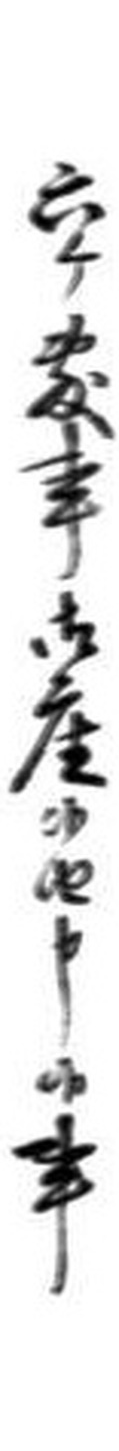六ケ敷事御座候由申候事
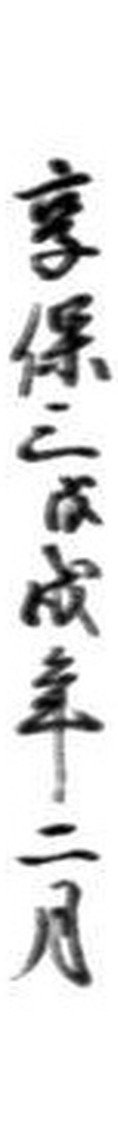享保三戊戌年二月
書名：家譜 三十二 吉邦公 従享保二年到享保三年
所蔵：福井県文書館 Fukui Prefectural Archives
